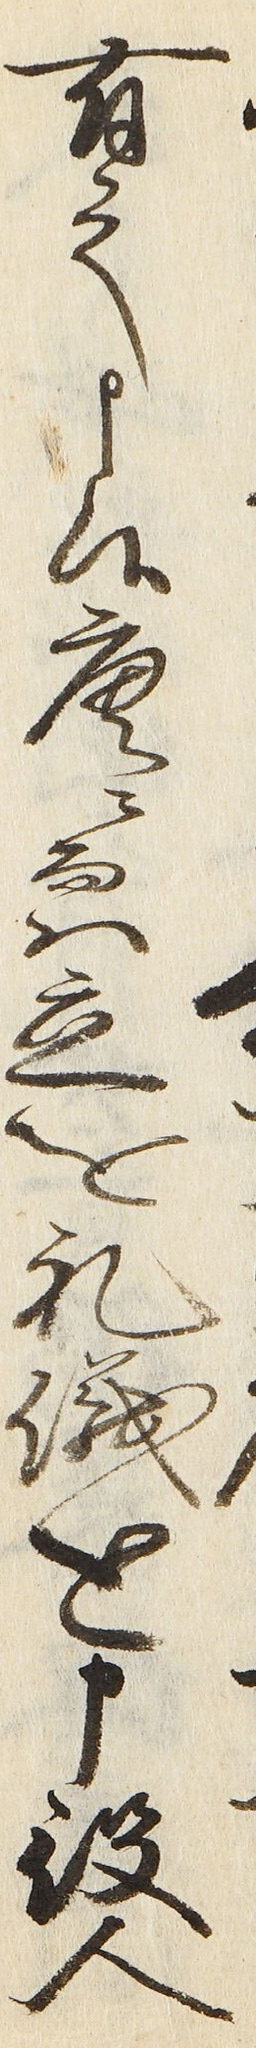有之申候唐にては立を礼儀と申役人
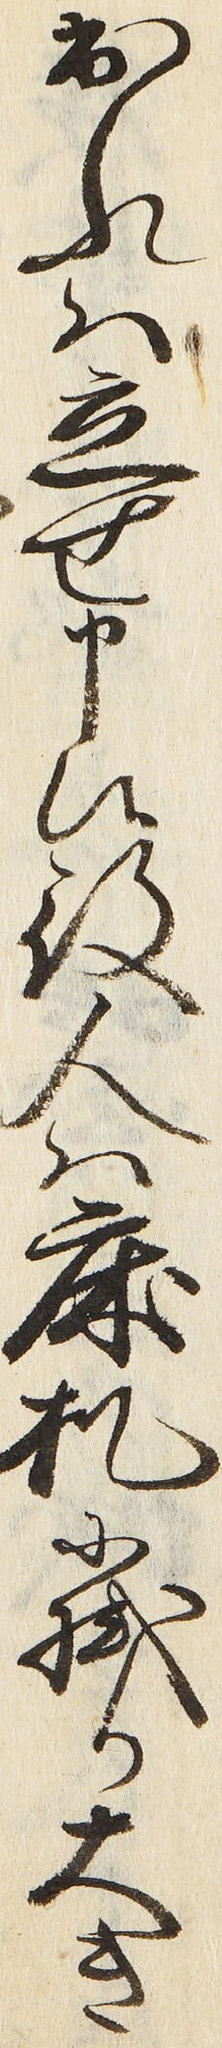出れは立せ申候役人は床机に掛り大き
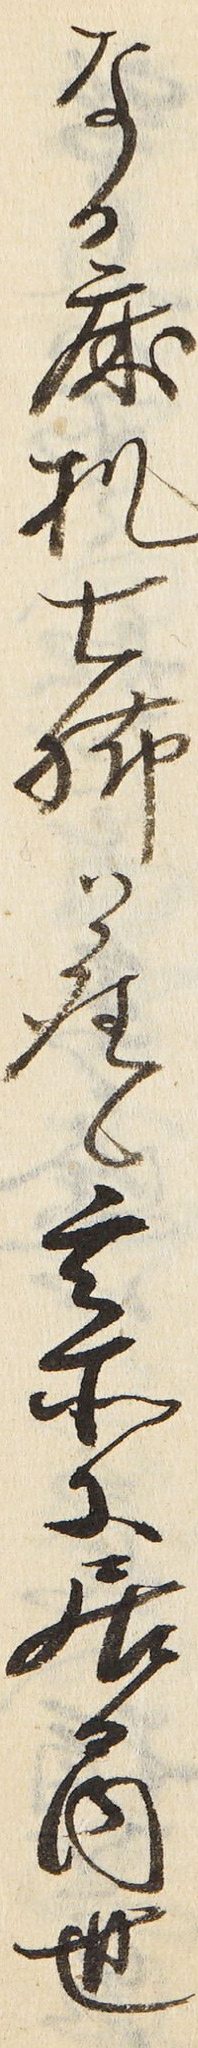なる床机七脚御座候其所に居る内世
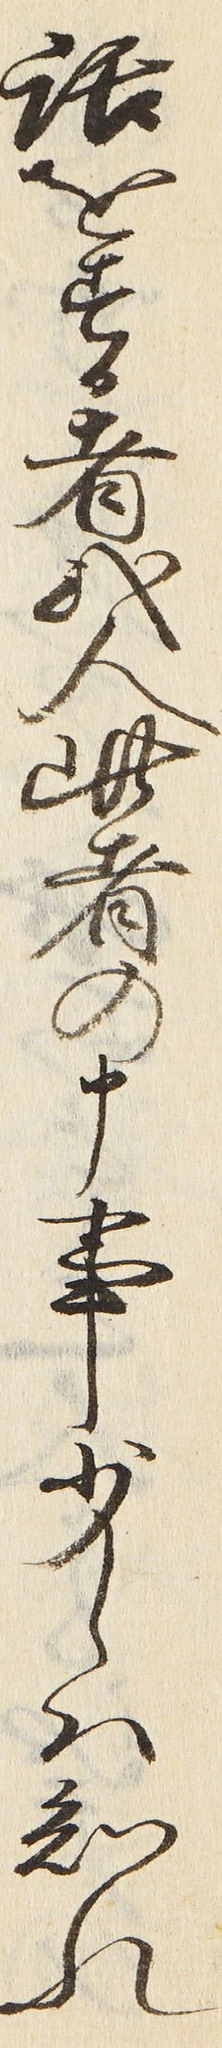話をする者弐人此者の申事少しは知れ
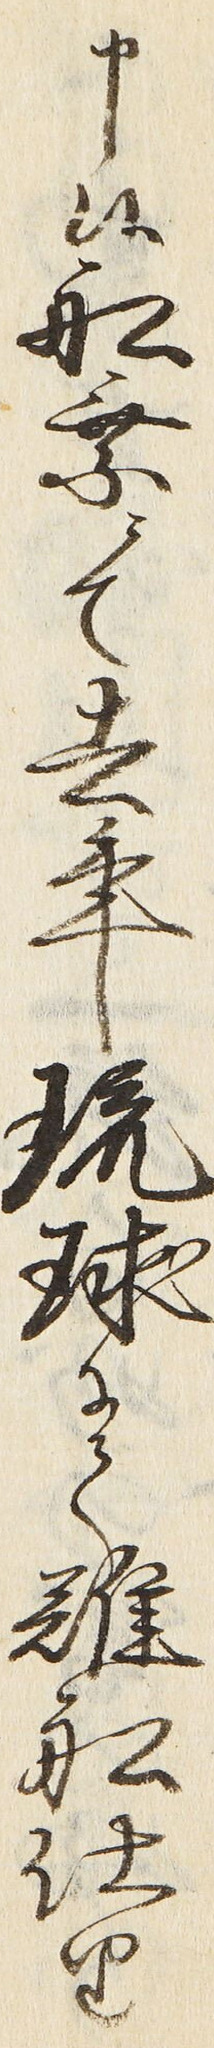申候船乗にて去年琉球にて難船仕り
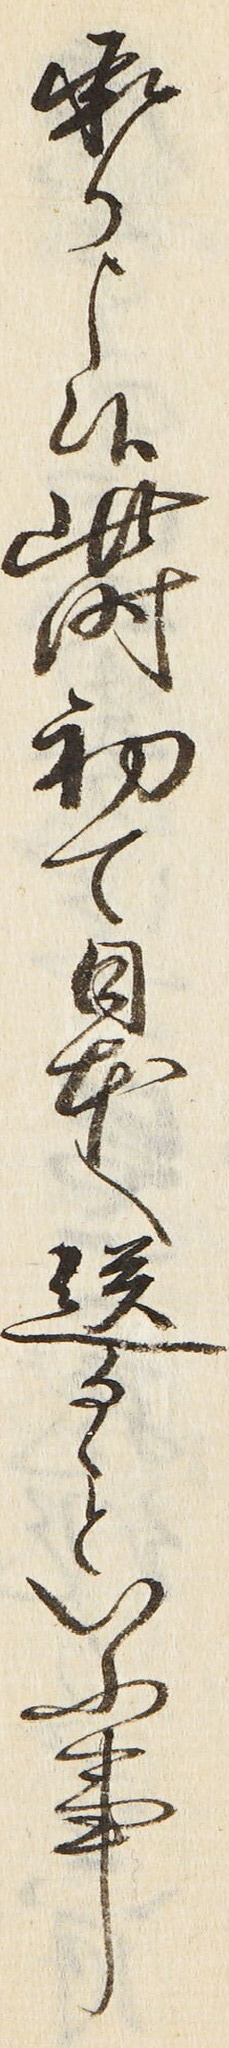承り申候此時初て日本へ送るといふ事
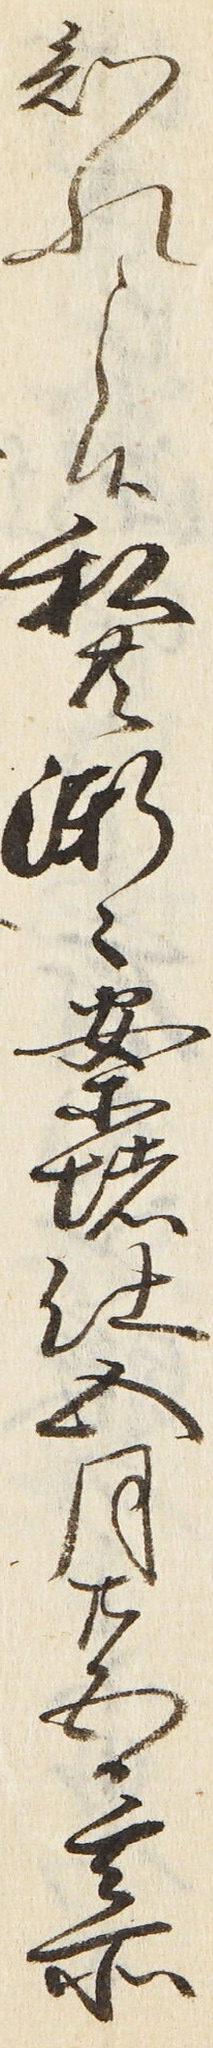知れ申候私共漸々安堵仕五月廿五日苑其所
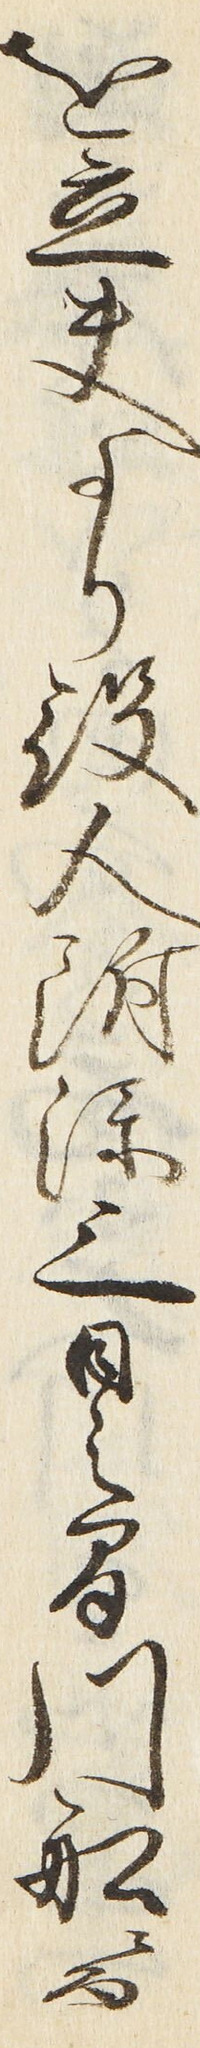を立夫より役人附添三日之間川船にて
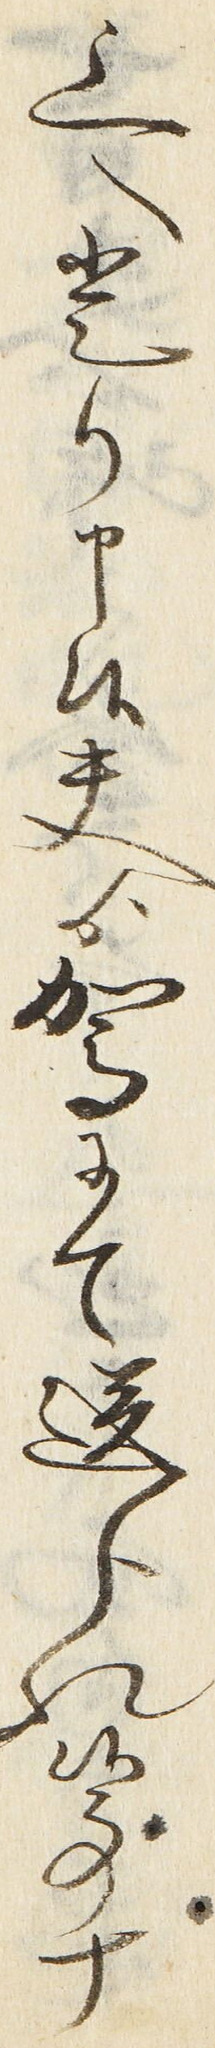上へ登り申候夫ゟ篭にて送られ候事十
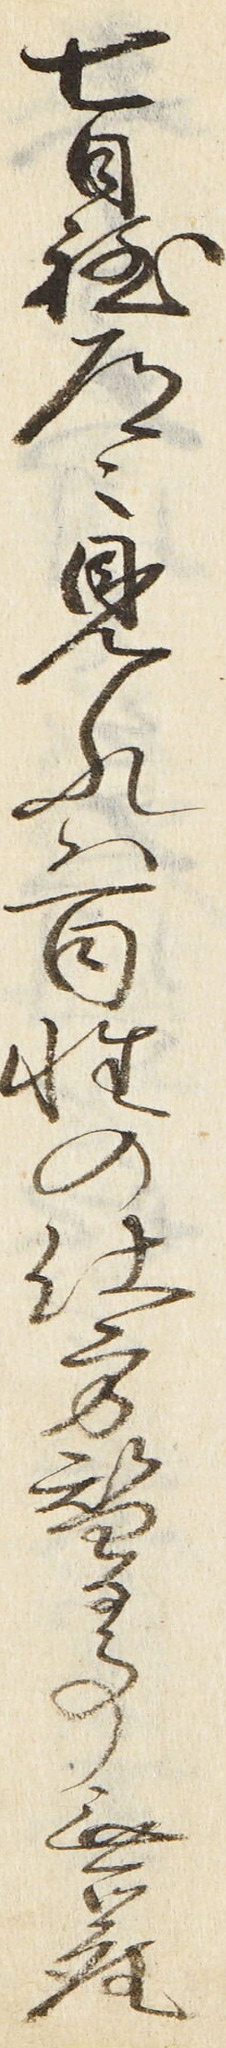七日程道々見れは百性の仕方替る事無御座
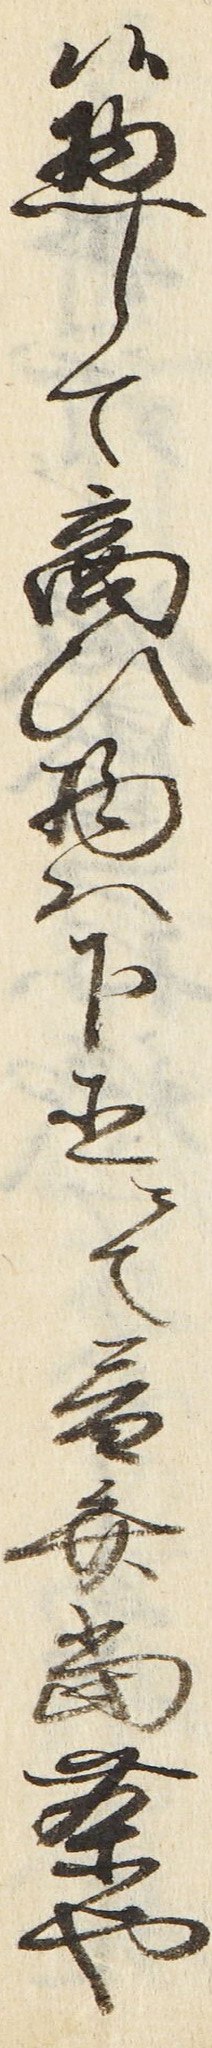候惣して商ひ物は下直にて昼弁当薬や

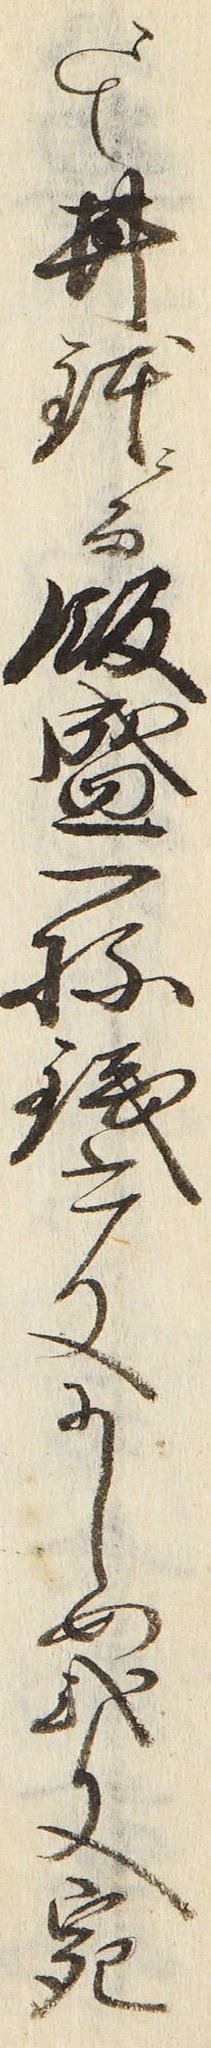にて丼鉢にて飯盛一杯銭六文にしめ弐文宛
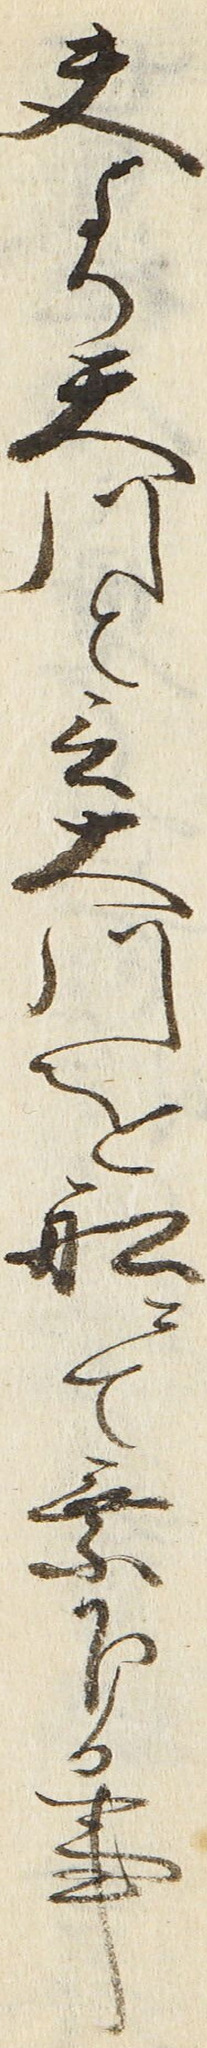夫より天川と云大門を船にて乗下る事
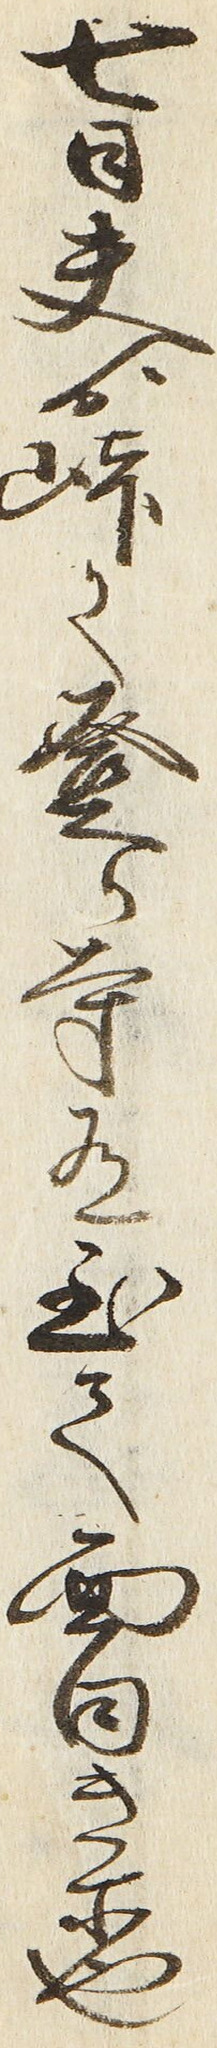七日夫ゟ峠に登り寺有至て面白き所也
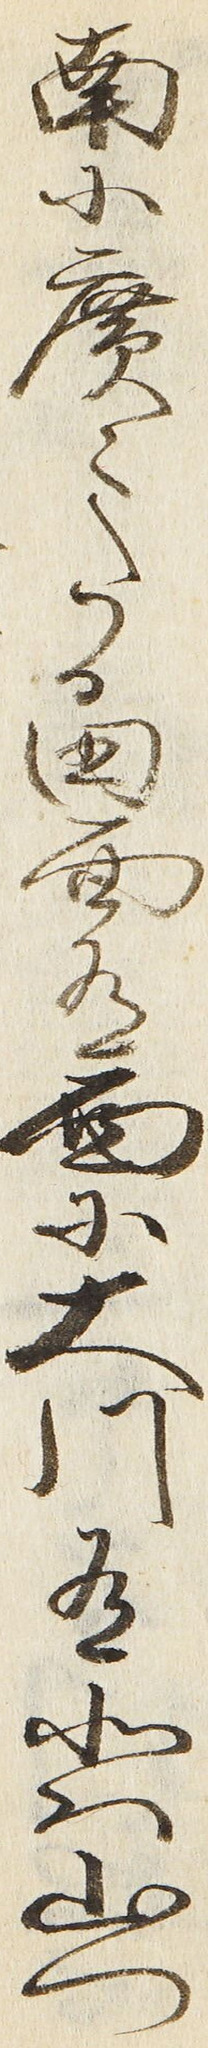南に広々たる田面有西に大川有北は山つ
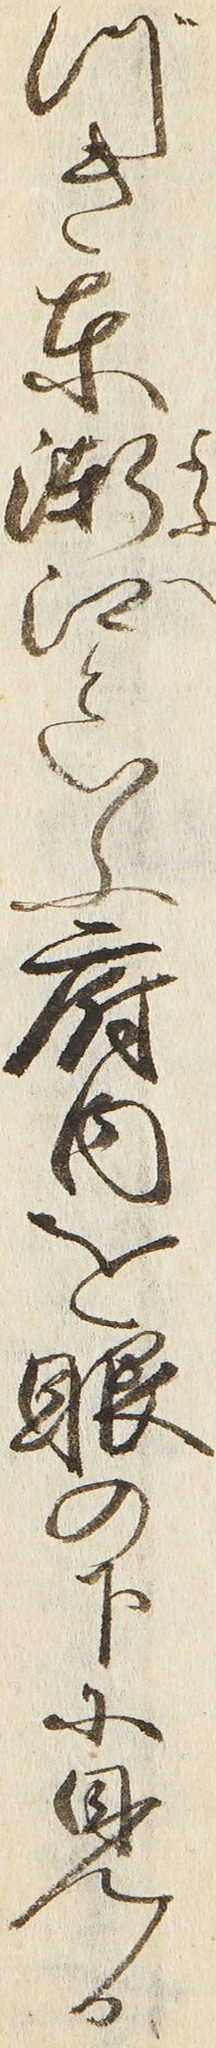づき東漸江といふ府内を眼の下に見る
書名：天保漂流記
